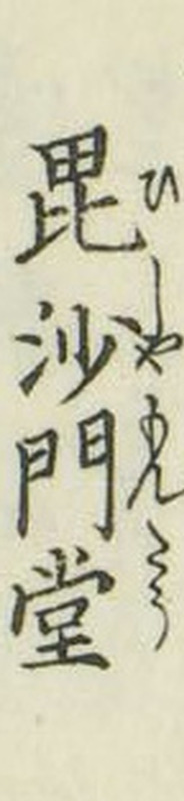毘沙門堂

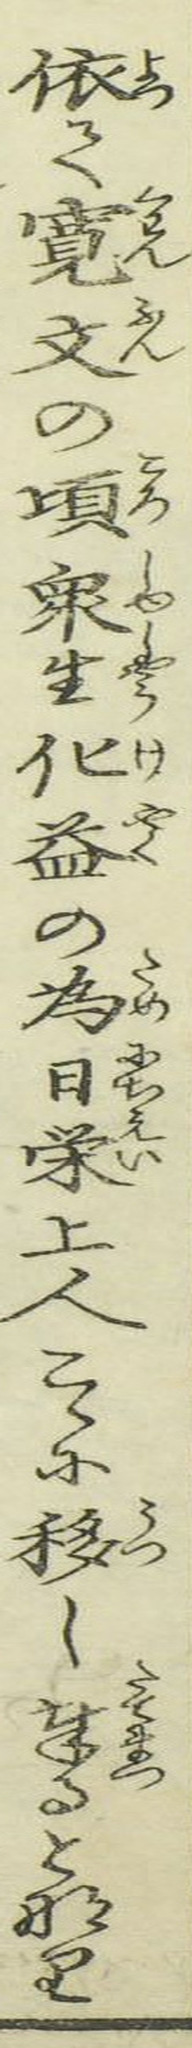依て寛文の頃衆生化益の為日栄上人こゝに移し奉るとなり
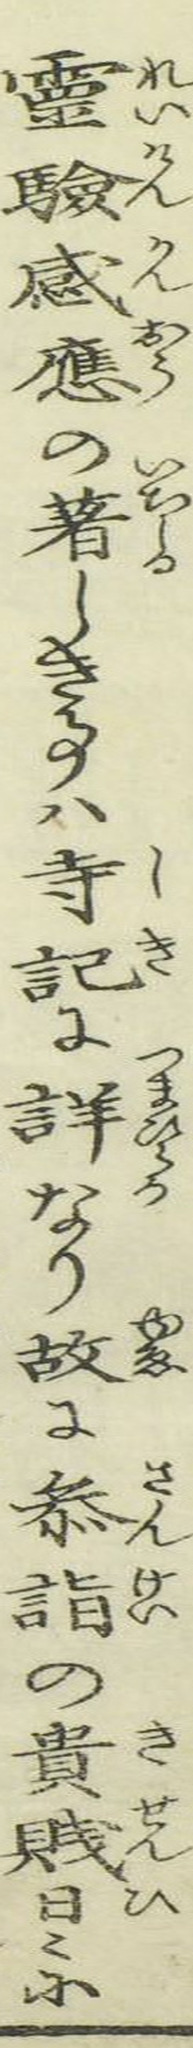霊験感應の著しき事は寺記に詳なり故に参詣の貴賤日々に
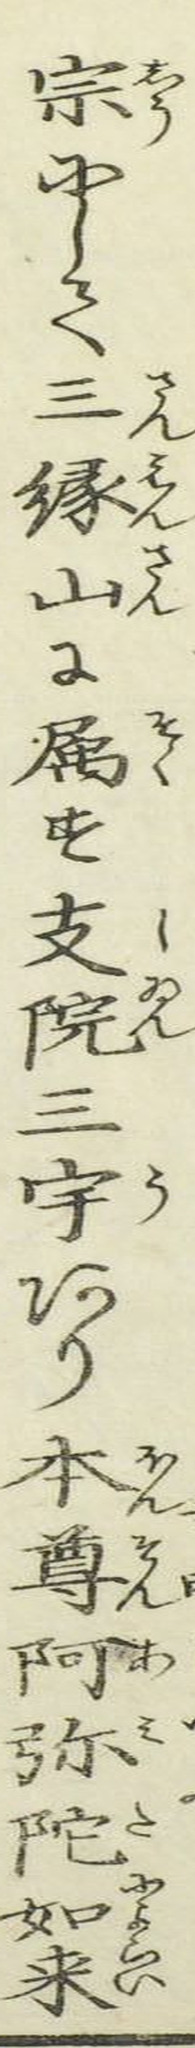宗にして三縁山に属す支院三宇あり本尊阿弥陀如来
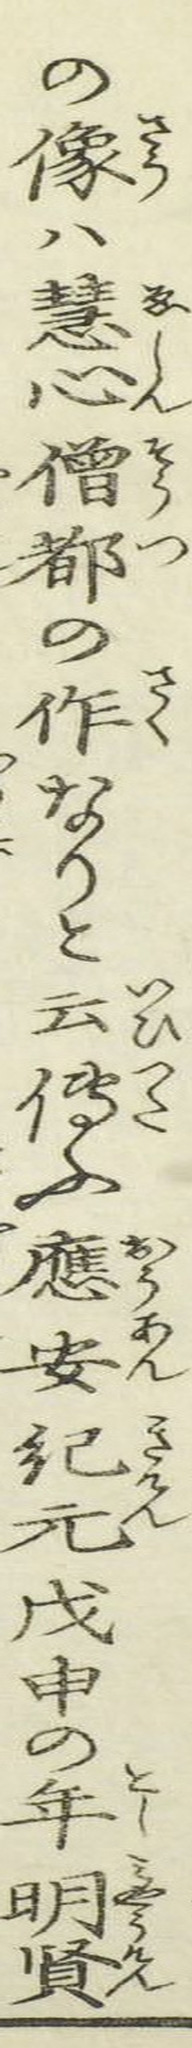の像は慧心僧都の作なりと云傳ふ應安紀元戊申の年明賢
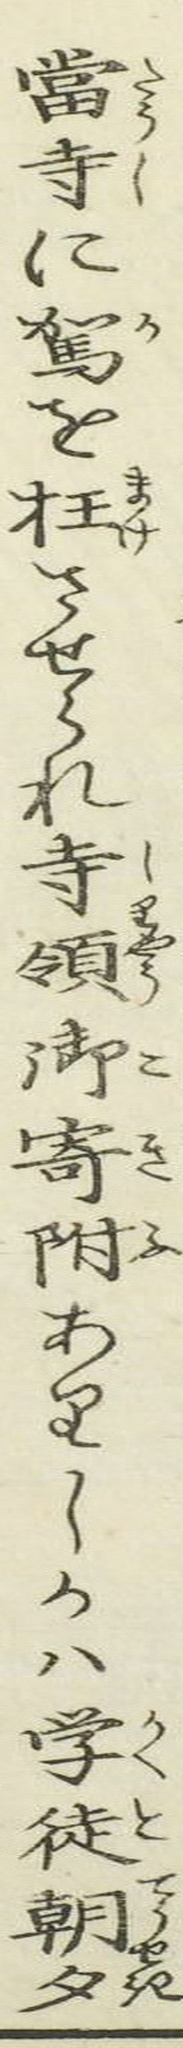當寺に駕を枉させられ寺領御寄附ありしかは学徒朝夕
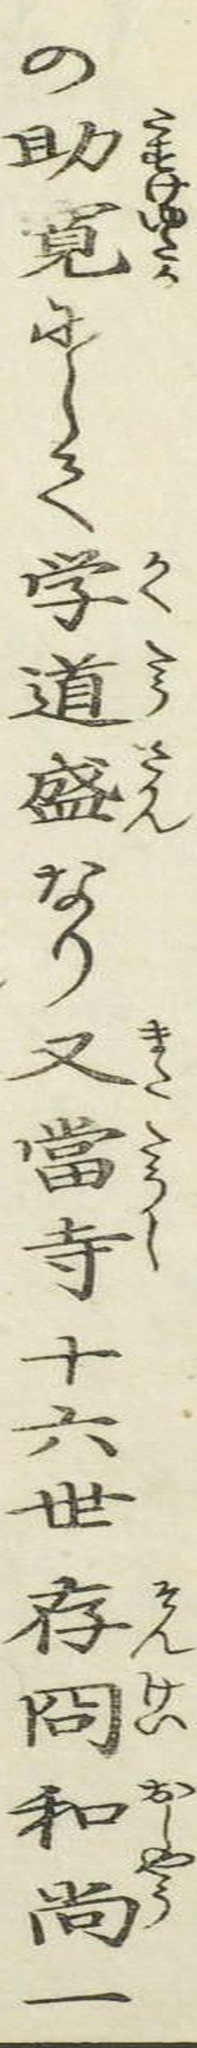の助寛にして学道盛なり又當寺十六世存冏和尚一
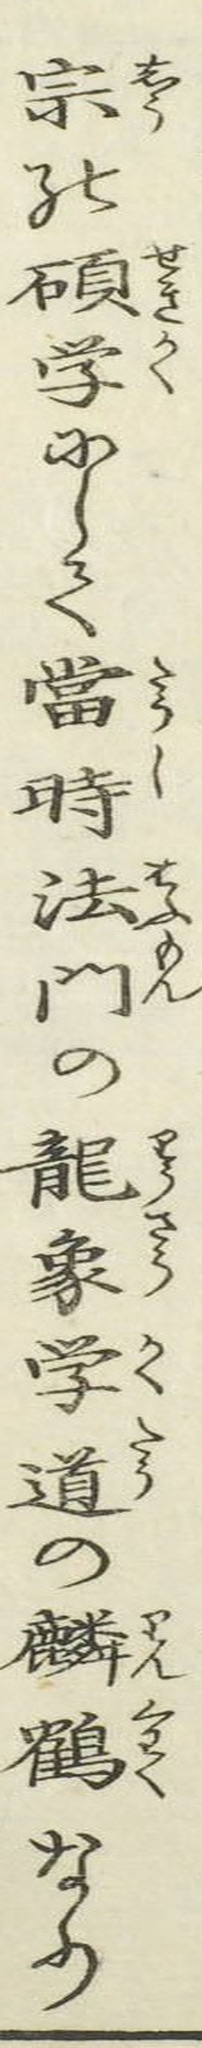宗の碩学にして當時法門の龍象学道の麟鶴なり
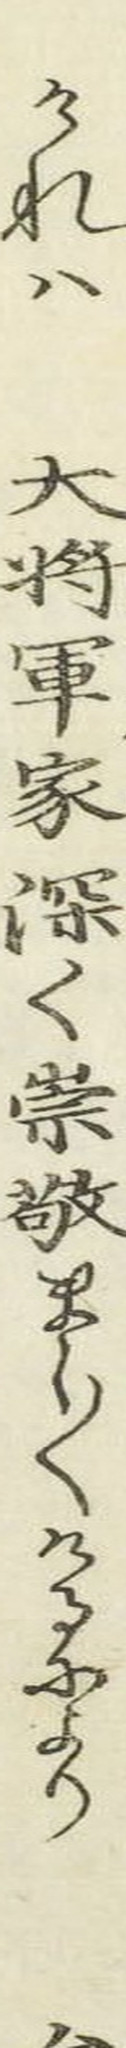けれは大将軍家深く崇敬まし〳〵けるにより
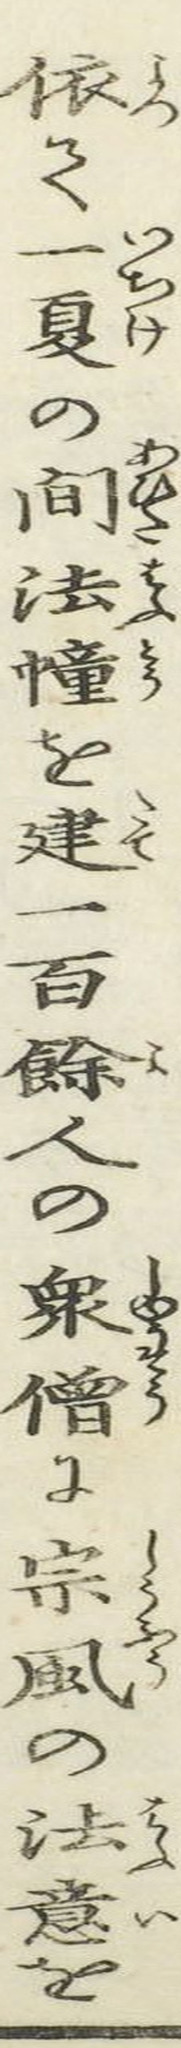依て一夏の間法幢を建一百餘人の衆僧に宗風の法意を
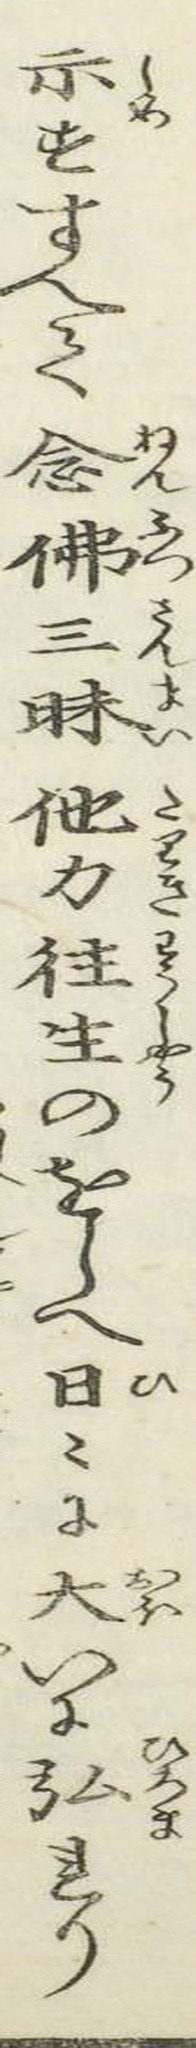示すすへて念佛三昧他力往生のをしへ日々に大いに弘れり
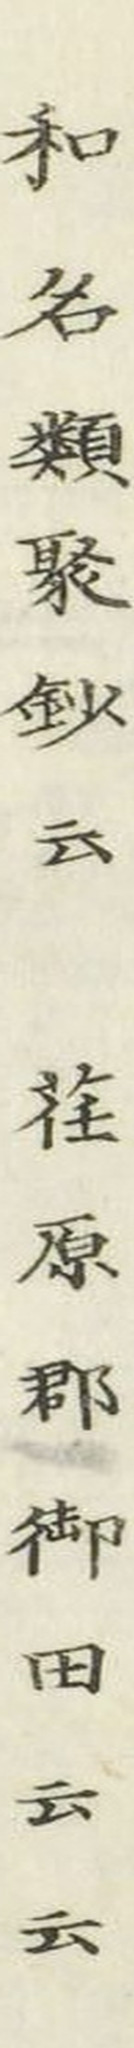和名類聚鈔云荏原郡御田云云
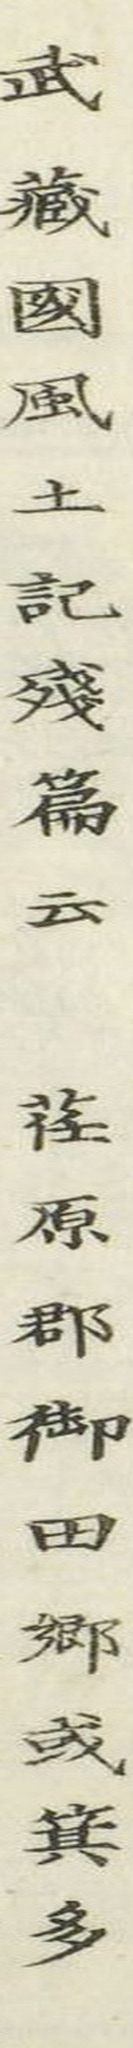武蔵國風土記残篇云荏原郡御田郷或箕多
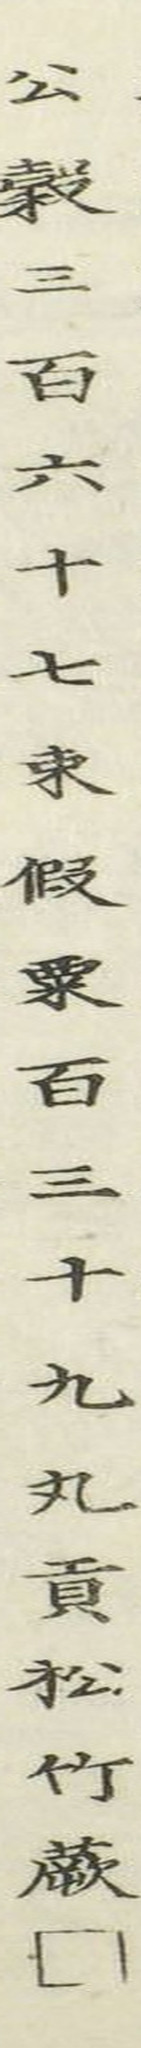公穀三百六十七束假粟百三十九丸貢松竹蕨▢
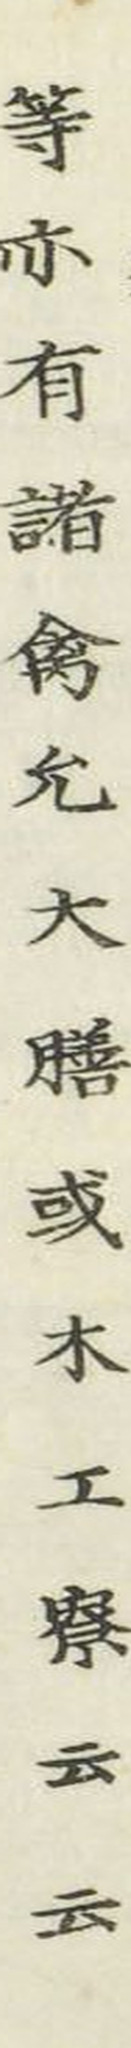等亦有諸禽允大膳或木工寮云云
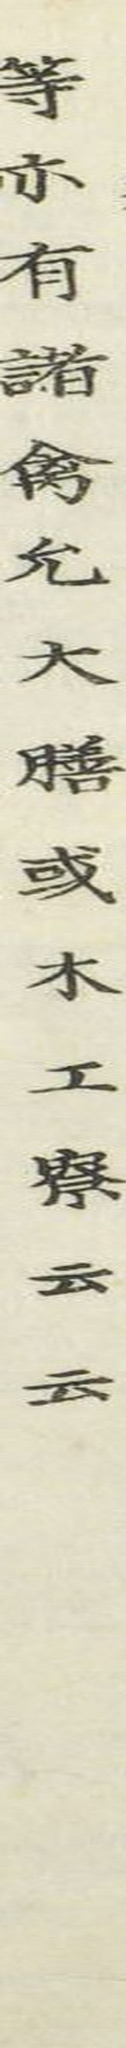等亦有諸禽允大膳或木工寮云云
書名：江戸名所図会 20巻 巻之3
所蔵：東京学芸大学教育コンテンツアーカイブ
